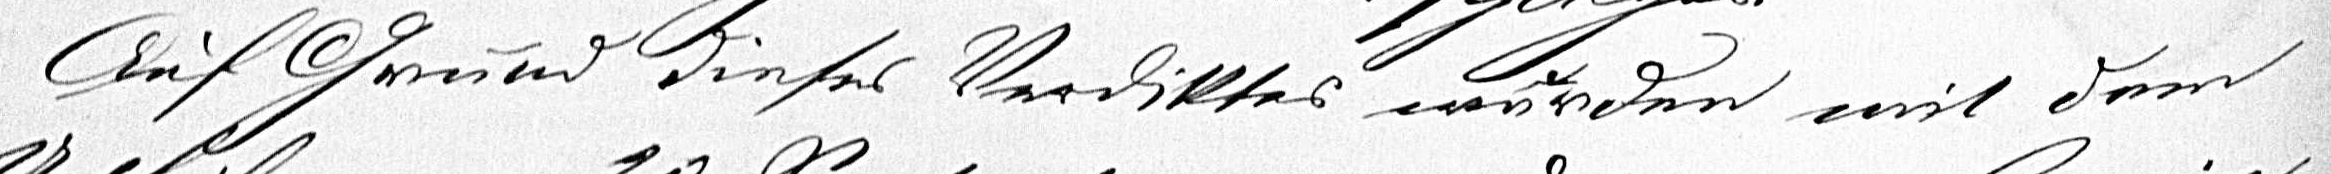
Auf Grund dieser Verdiktes wurden mit dem
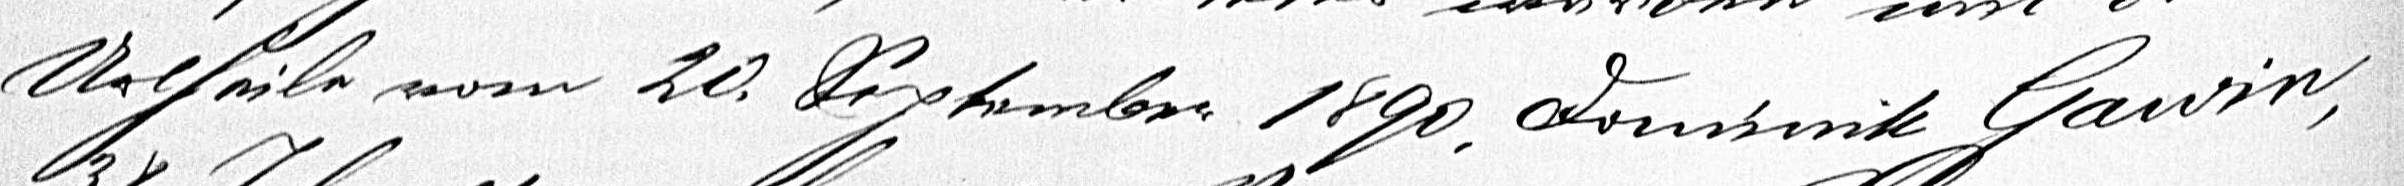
Urtheil vom 20. September 1890, Dominik Gawin,
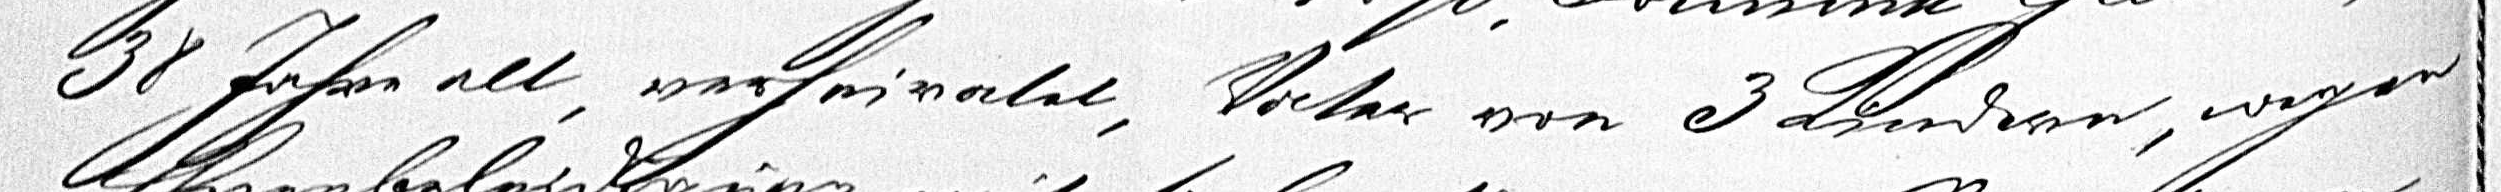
38 Jahre alt, verheiratet, Vater von 3 Kindern, wegen
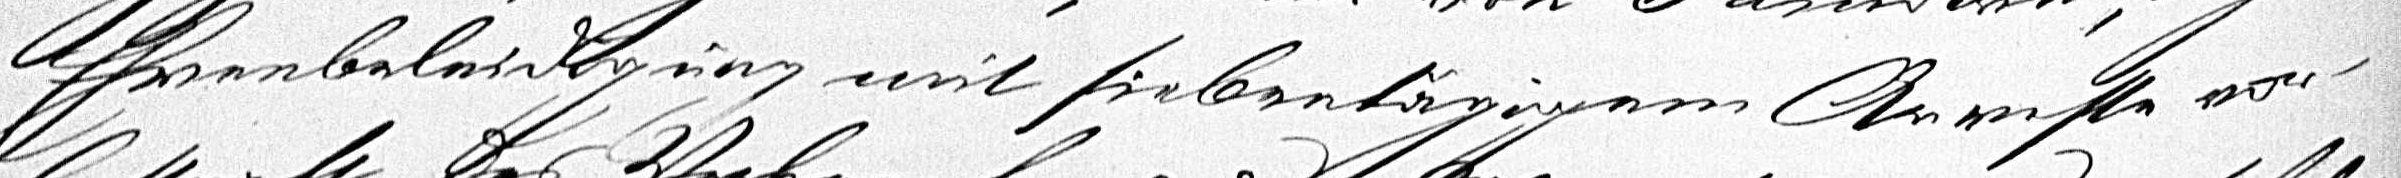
Ehrenbeleidigung mit siebentagigem Arreste vor¬
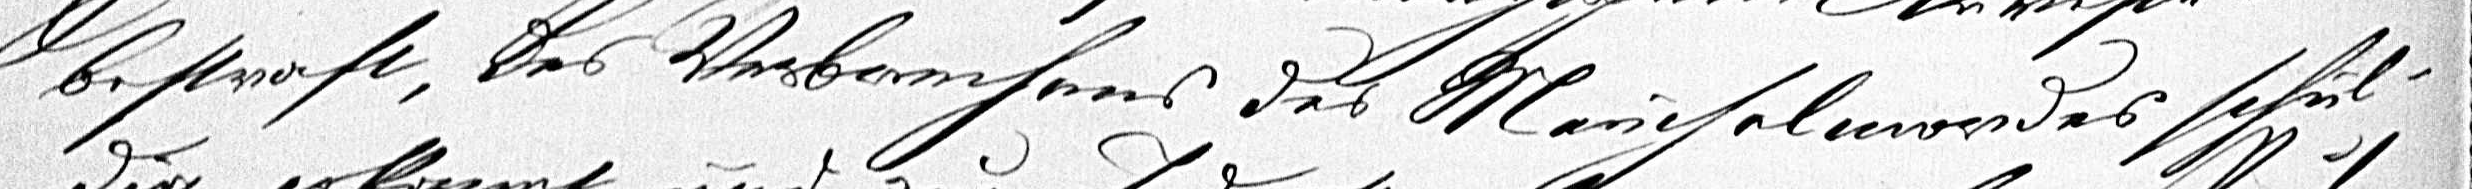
bestraft, des Verbrechens des Meuchelmordes schul¬
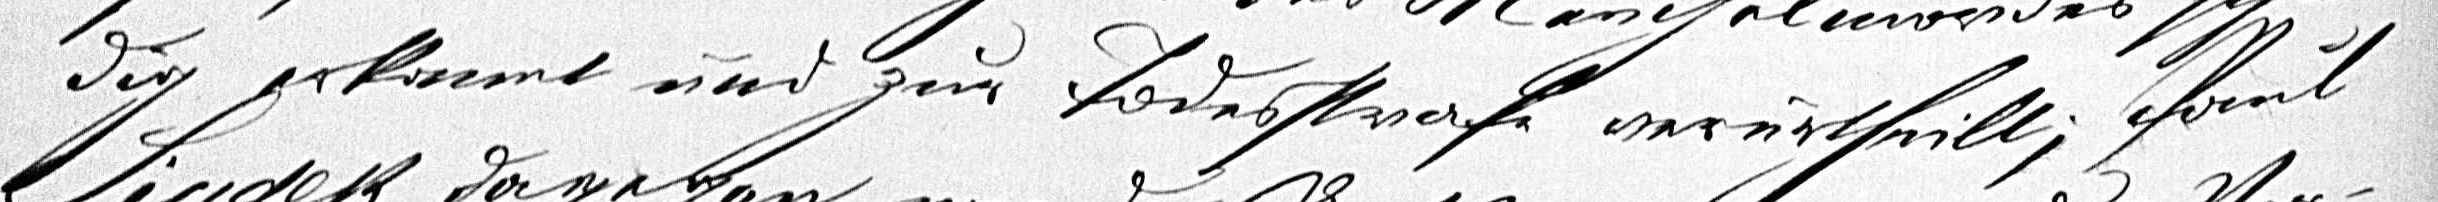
dig gekannt und zur Todesstrafe verurtheilt. Paul
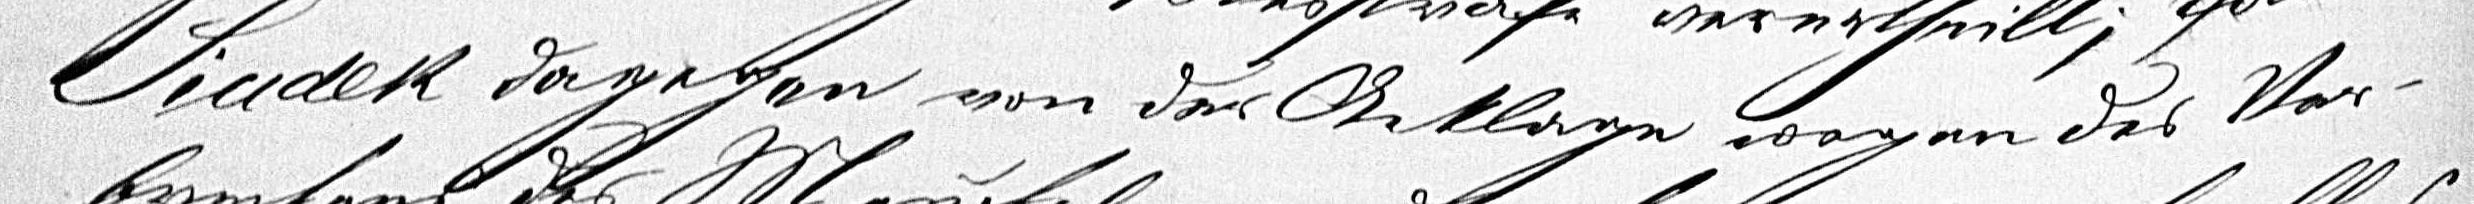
Sindek dagegen von der Anklage wegen des Ver¬
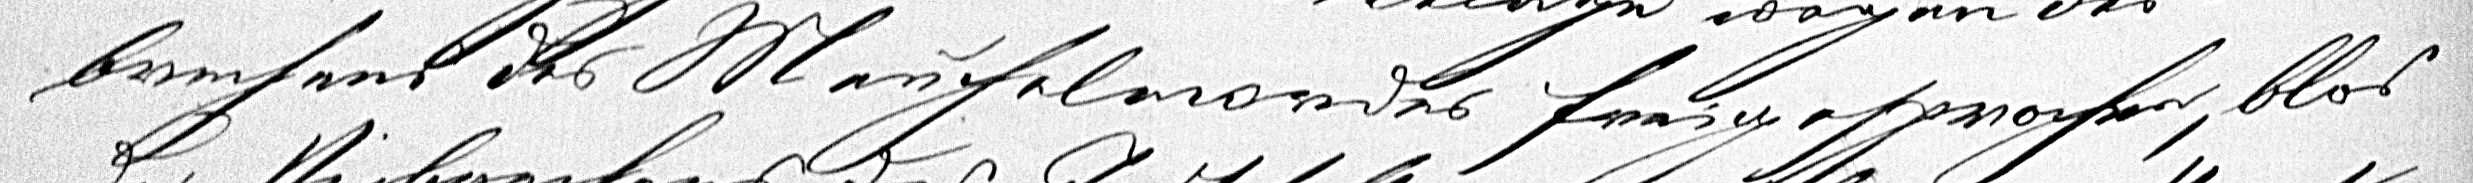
brechens des Meuchelmordes freigesprochen, blos
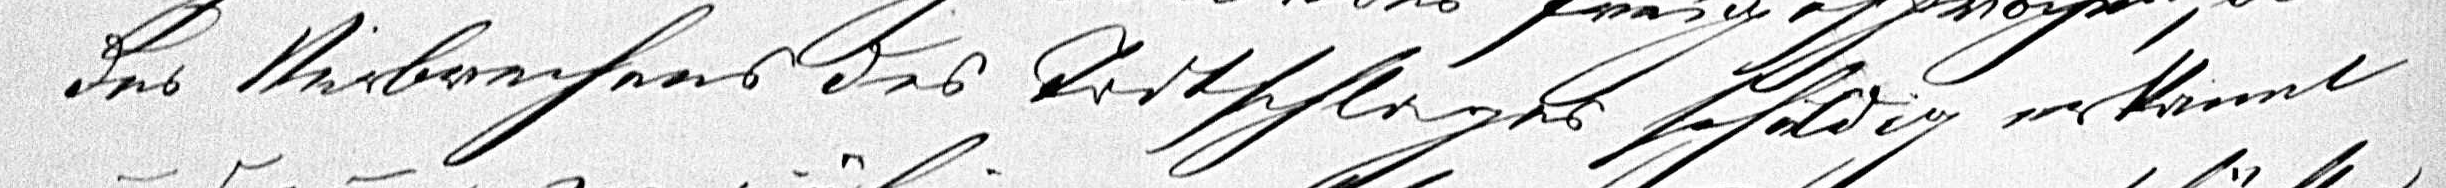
des Verbrechens des Todtschlages schuldig erkannt
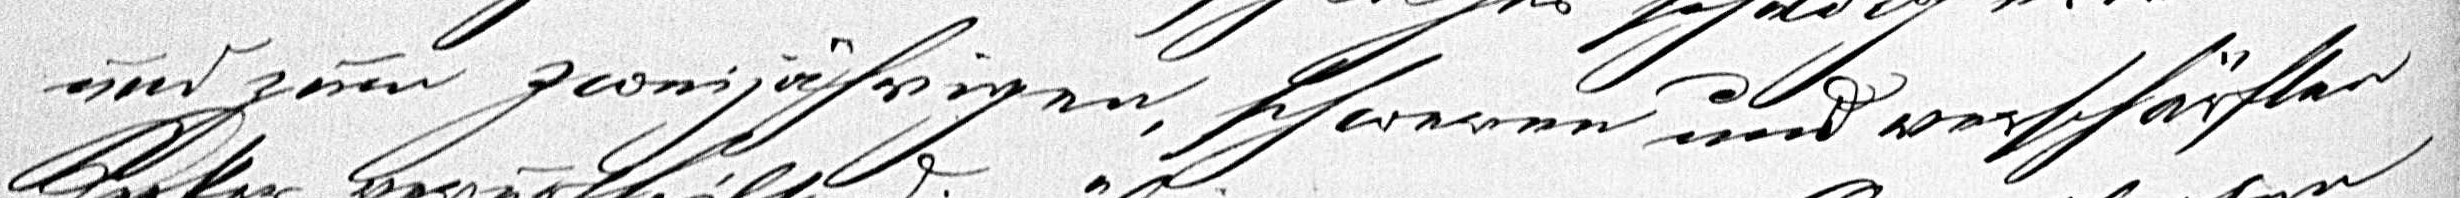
und zum zweijährigen, schweren und verschärften
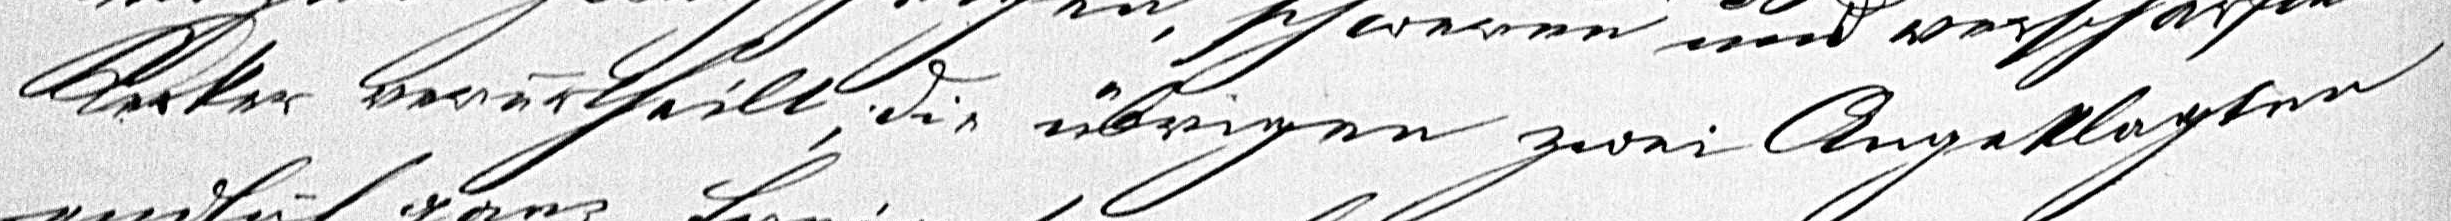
Kerker verurtheilt, die übrigen zwei Angeklagten
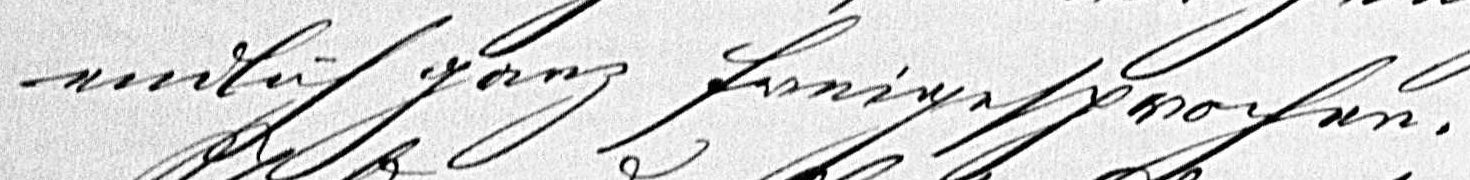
endlich ganz freigesprochen.
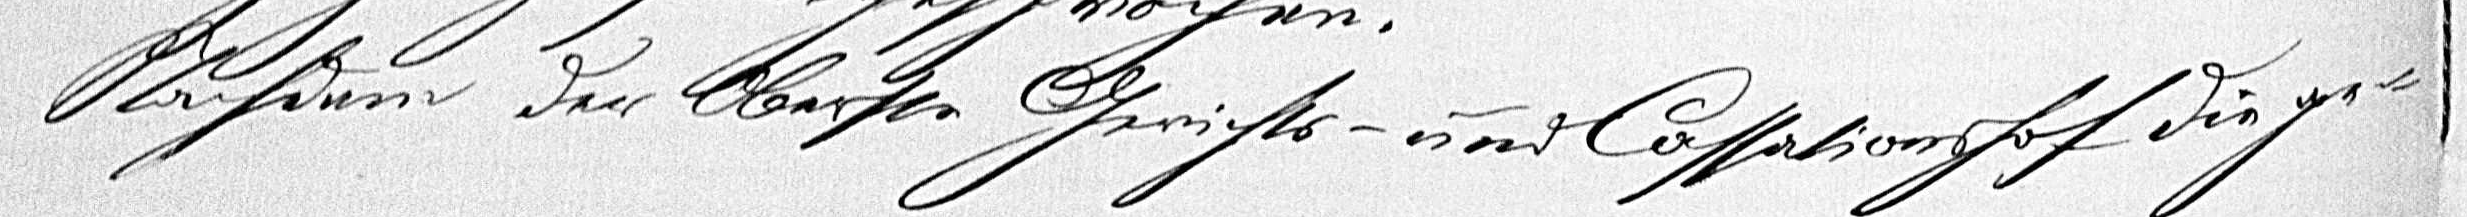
Nachdem der Oberste Gerichts- und Cassationshof die ge¬
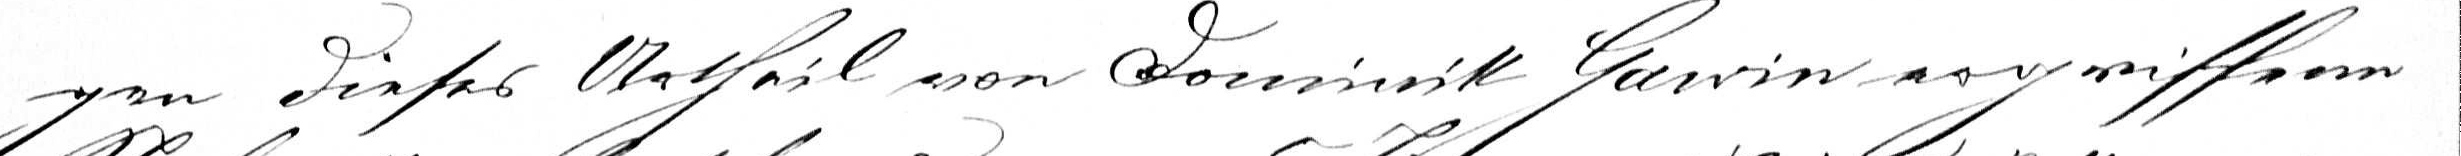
gen dieses Urtheil von Dominik Gawin ergriffene
